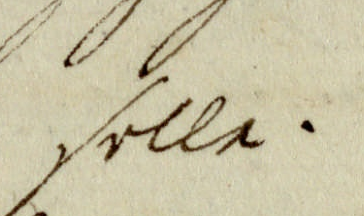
solle.
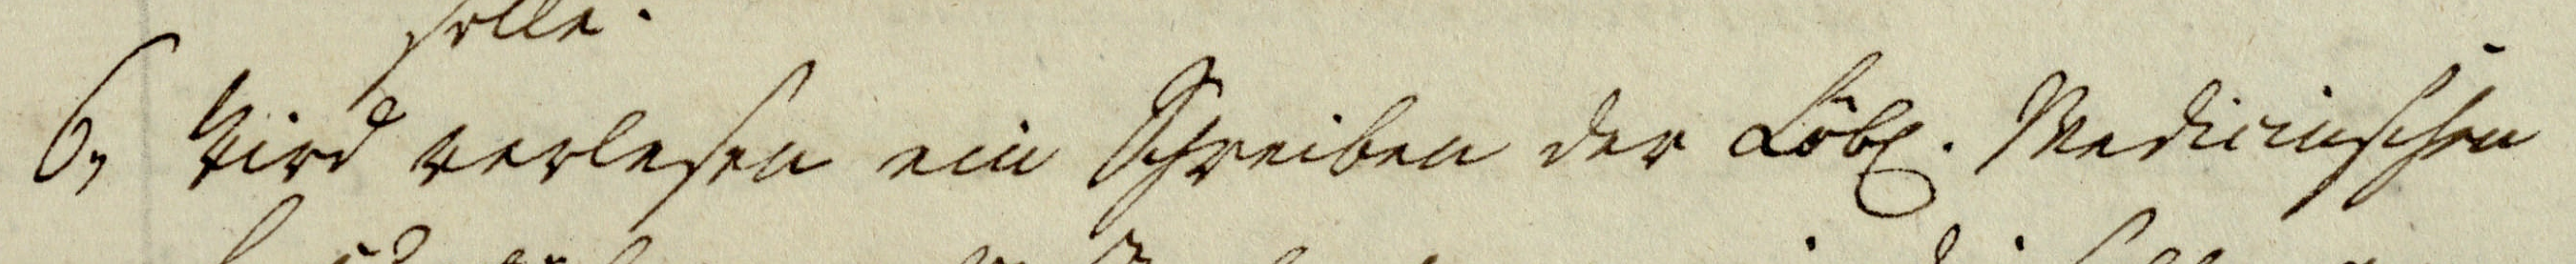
6. Wird verlesen ein Schreiben der Löbl. Medicinischen
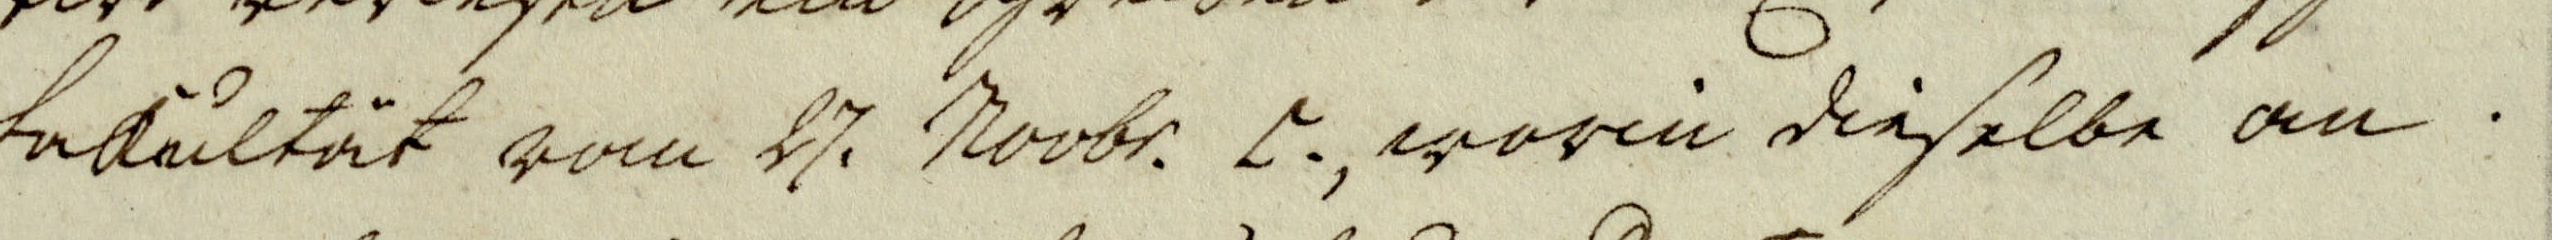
Fakultät vom 27. Novbr. c., worin dieselbe an¬
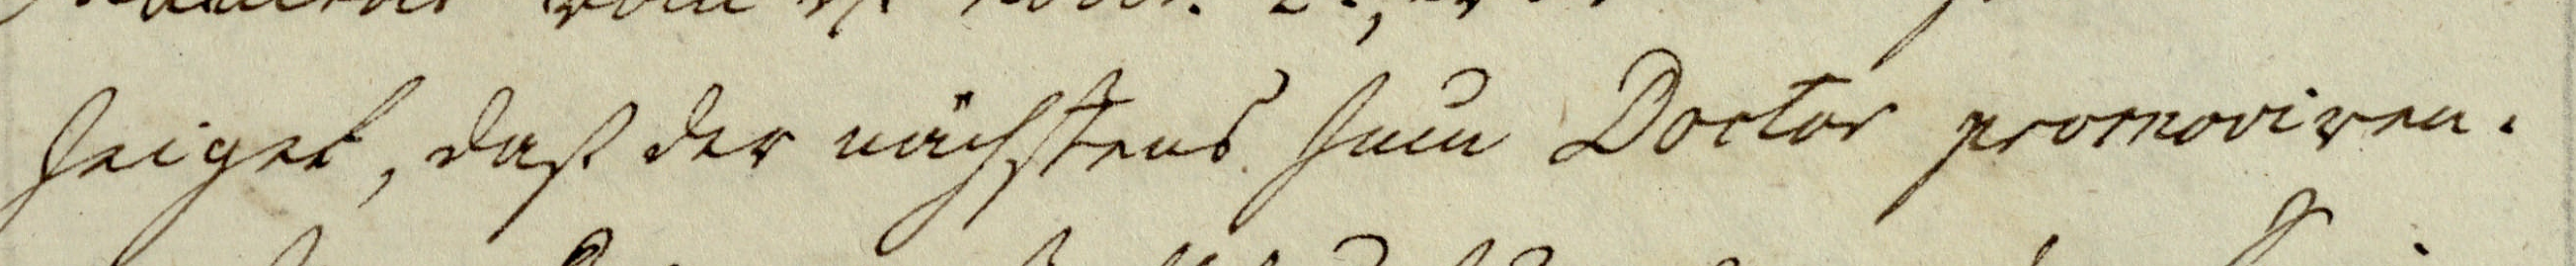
zeiget, daß der nächstens zum Doctor promoviren
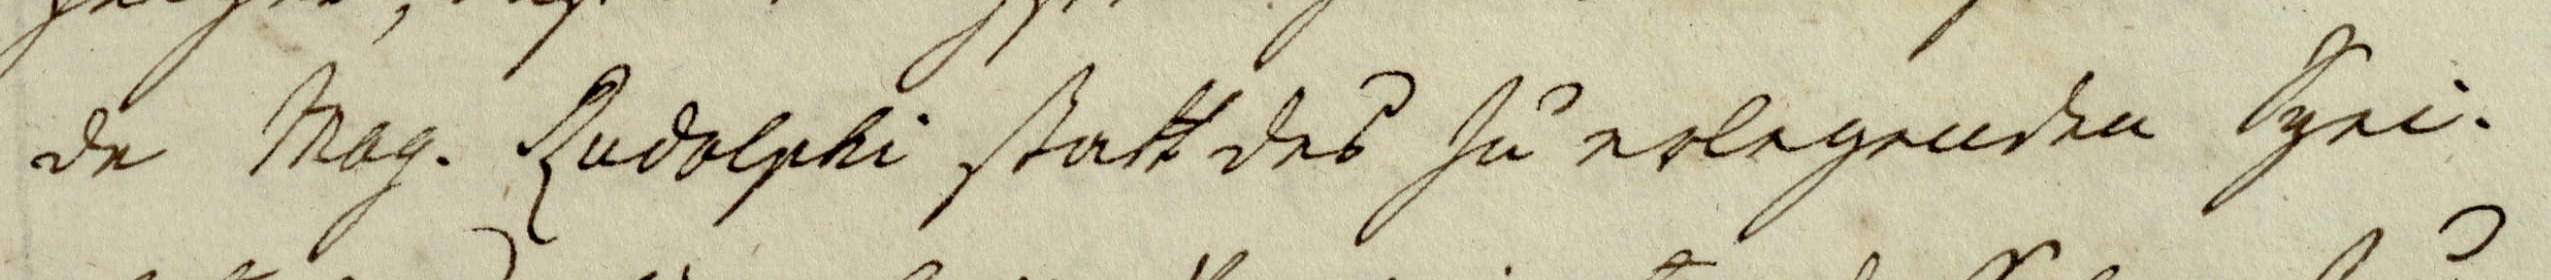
de Mag. Rudolphi statt des zu erlegenden Spei¬
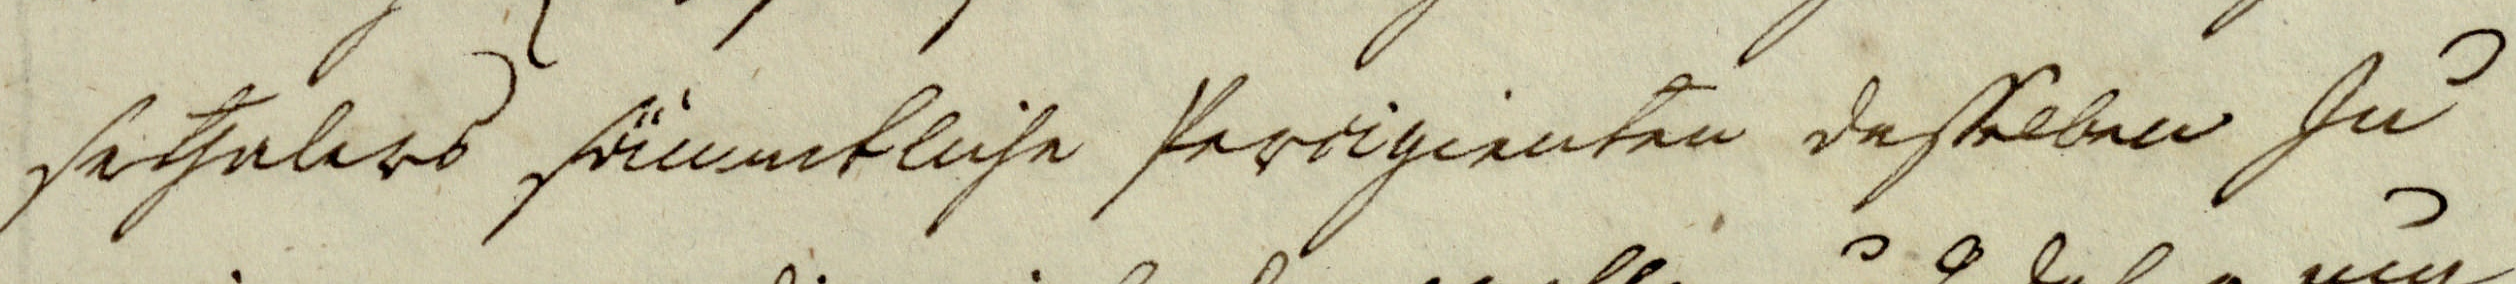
sethalers sämmtliche Percipienten desselben zu
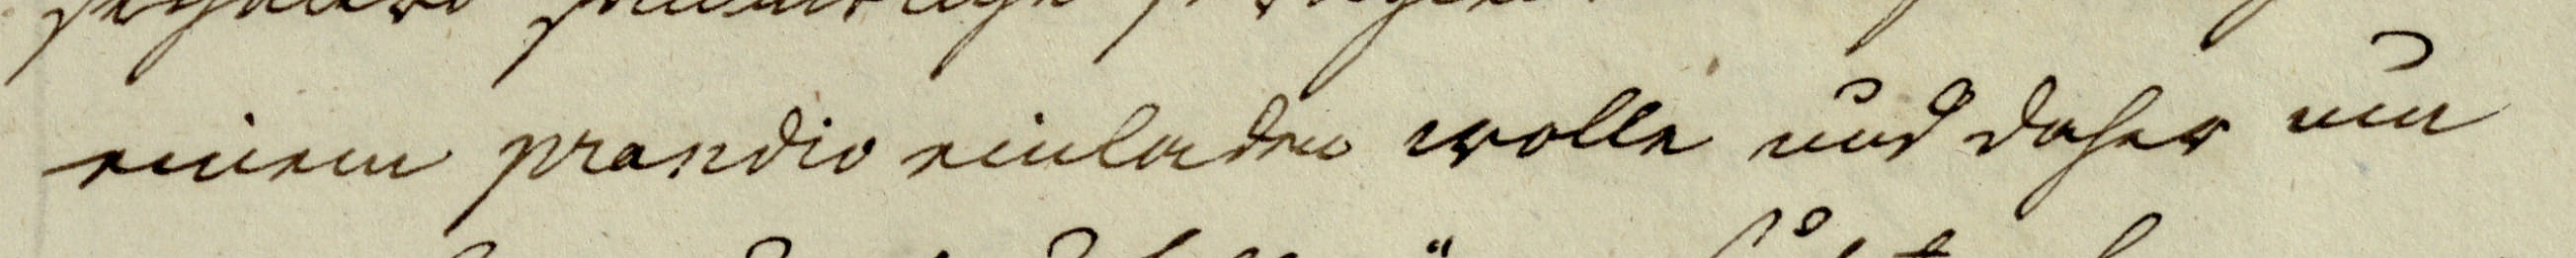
einem prandio einladen wolle und daher um
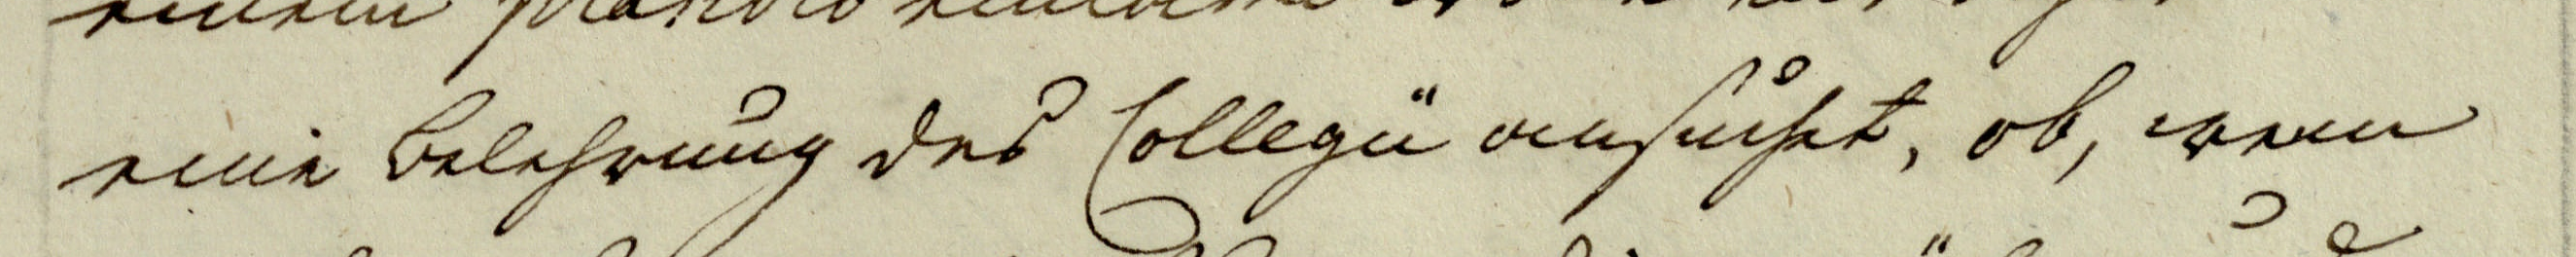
eine Belehrung des Collegii ansuchet, ob, wenn
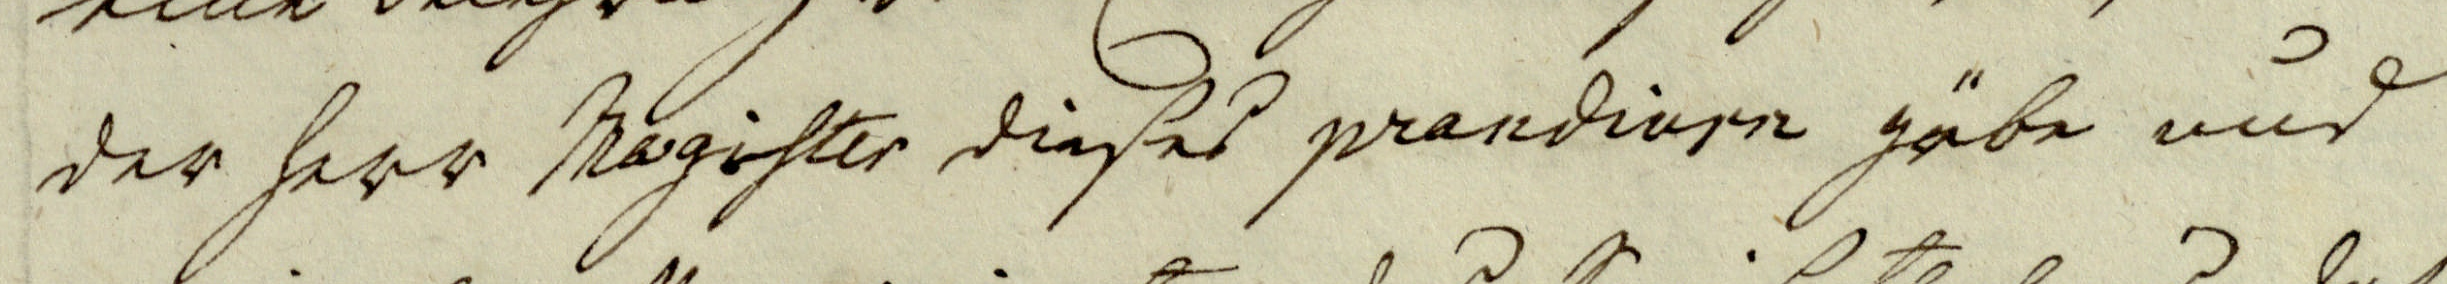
der Herr Magister dieses prandium gäbe und
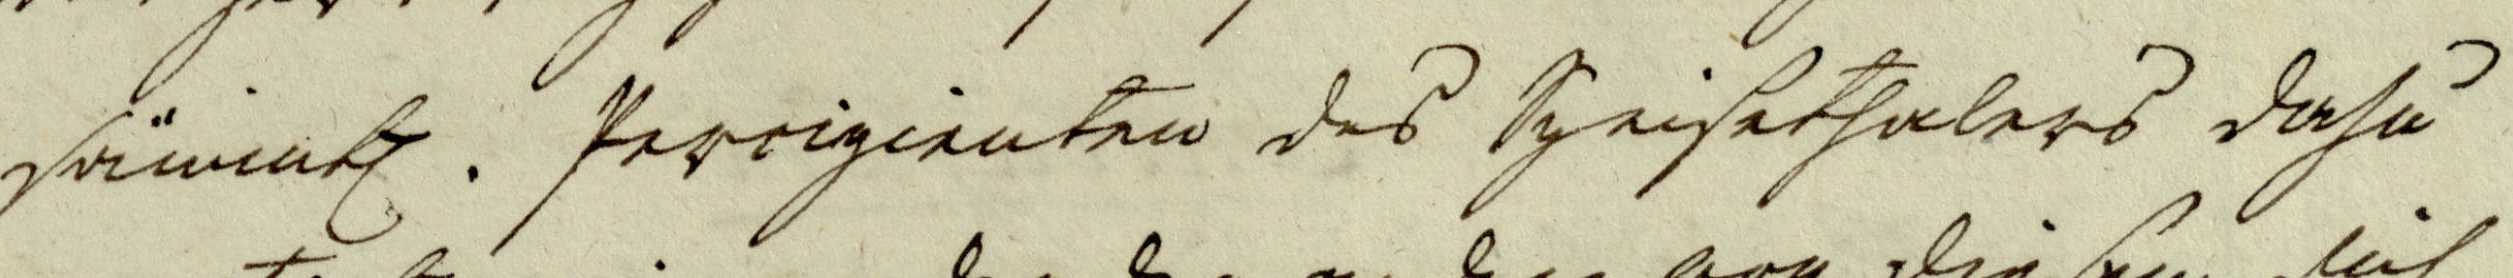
sämmtl. Percipienten des Speisethalers dazu
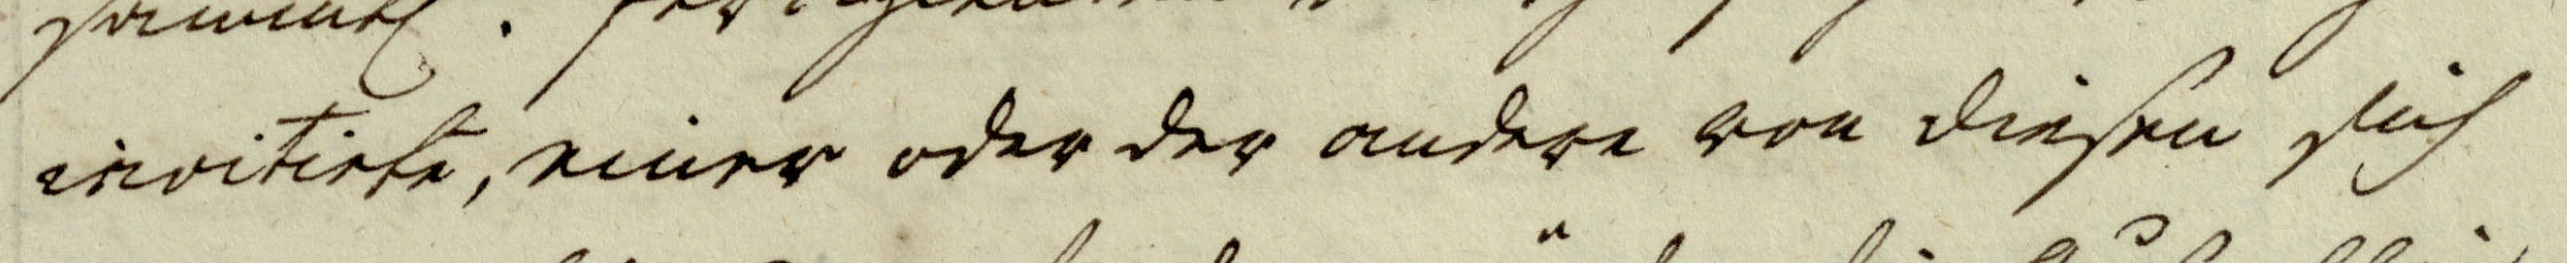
invitirte, einer oder der andere von diesen sich
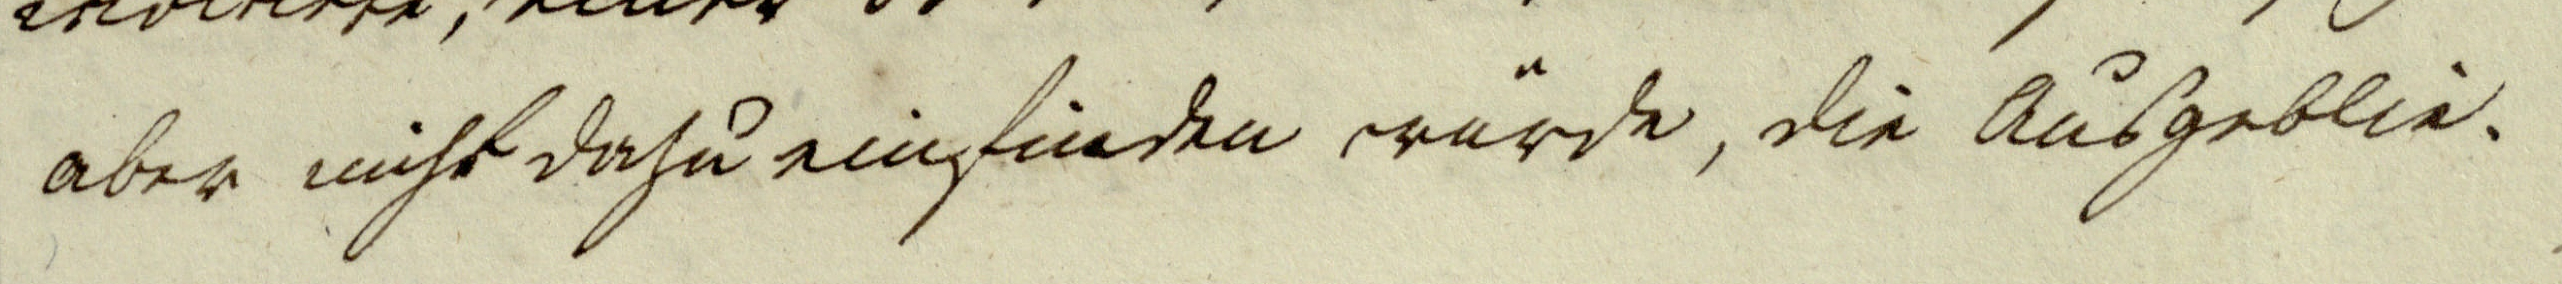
aber nicht dazu einfinden würde, die Ausgeblie¬
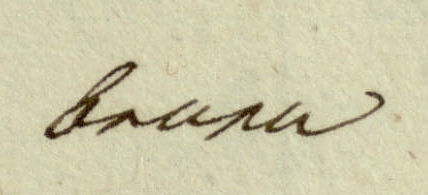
benen
